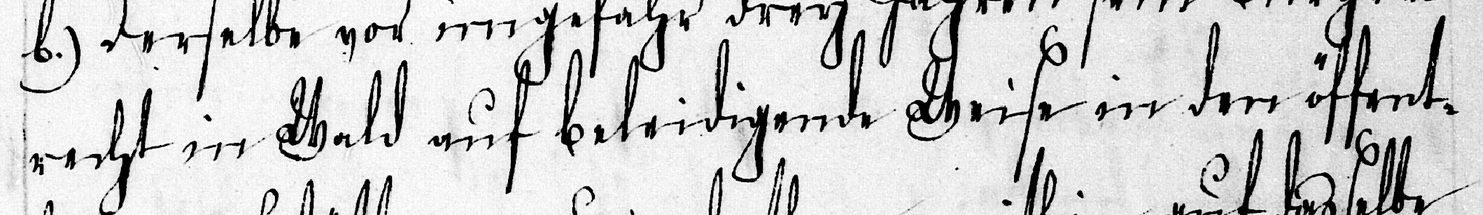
recht in Wald auf beleidigende Weise in den öffent¬
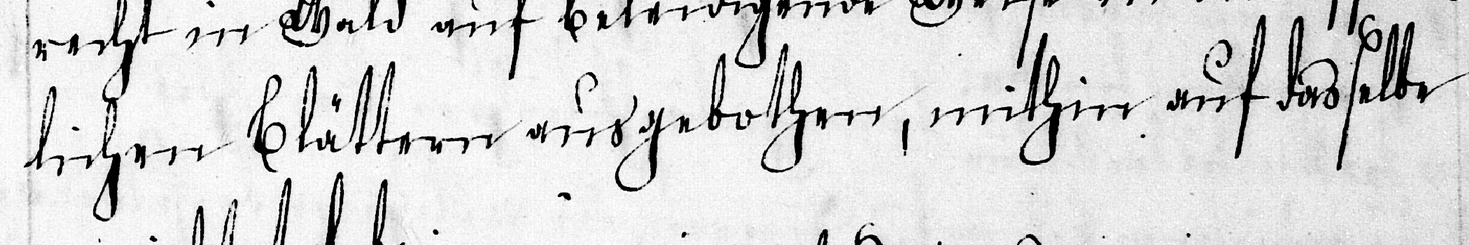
lichen Blättern ausgebothen, mithin auf dasselbe
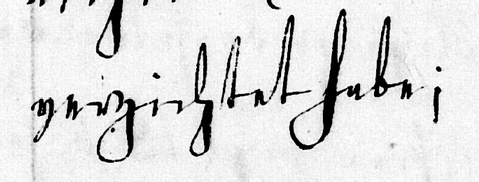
verzichtet habe;
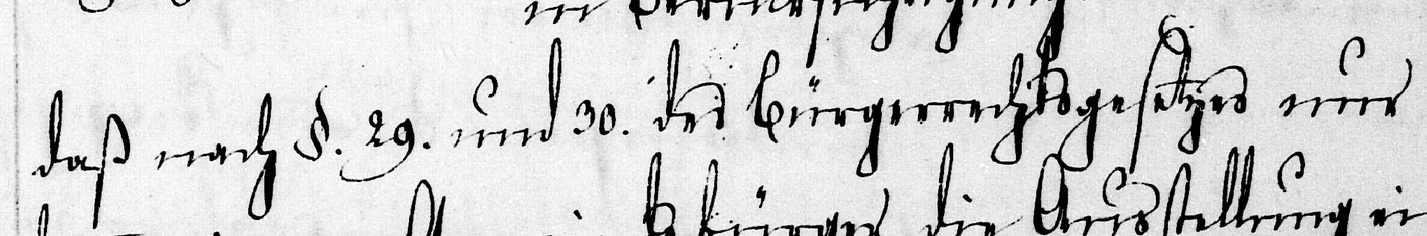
daß nach §. 29. und 30. des Bürgerrechtsgesetzes nur
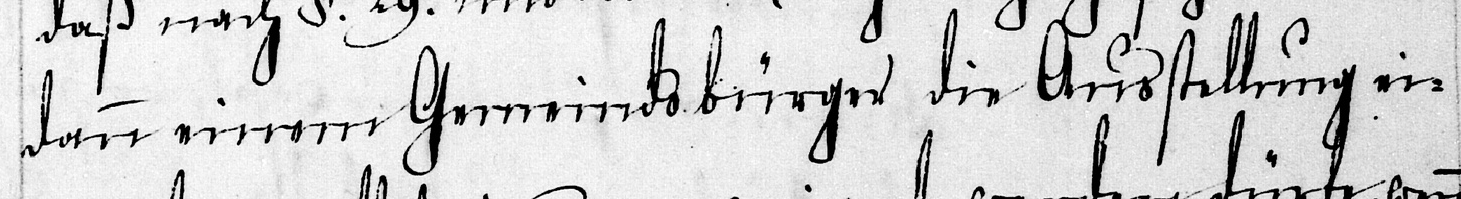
dann einem Gemeindsbürger die Ausstellung ei¬
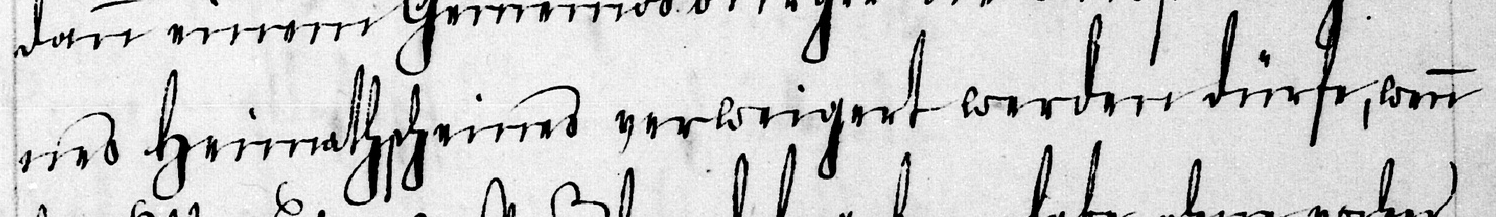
nes Heimathscheines verweigert werden dürfe, wenn
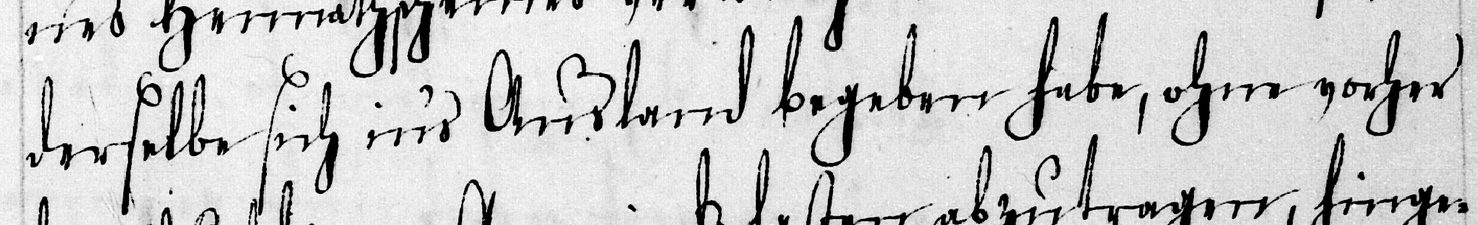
derselbe sich in’s Ausland begeben habe, ohne vorher
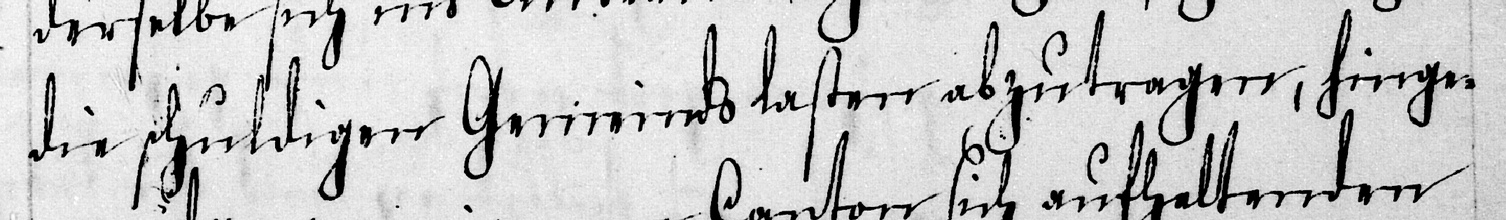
die schuldigen Gemeindslasten abzutragen, hinge¬
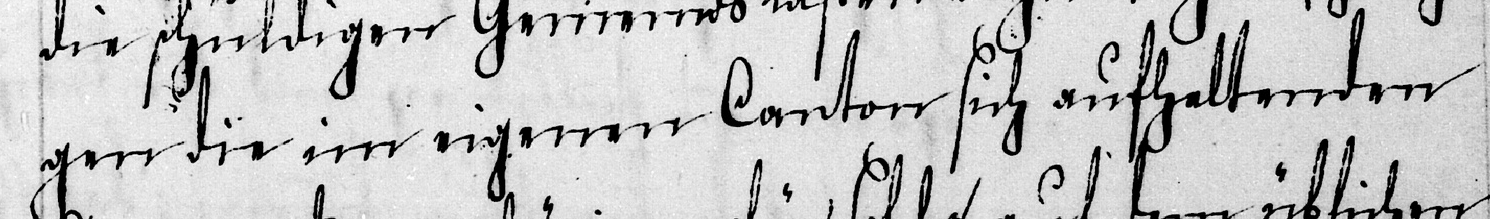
gen die im eigenen Canton sich aufhaltenden
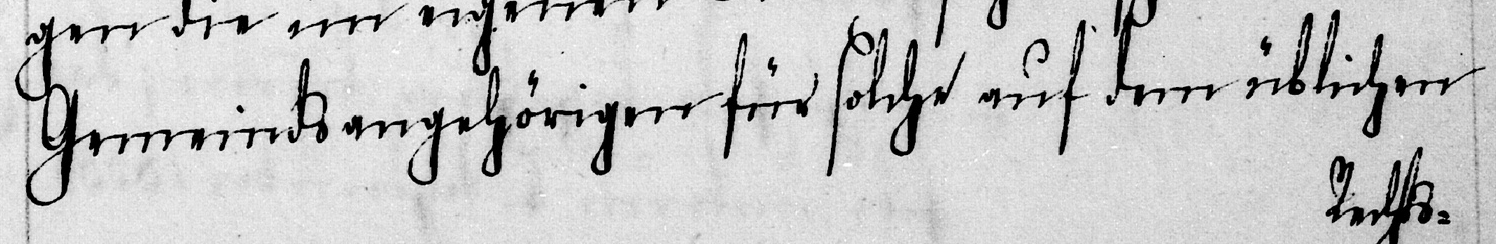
Gemeindsangehörigen für solche auf dem üblichen
